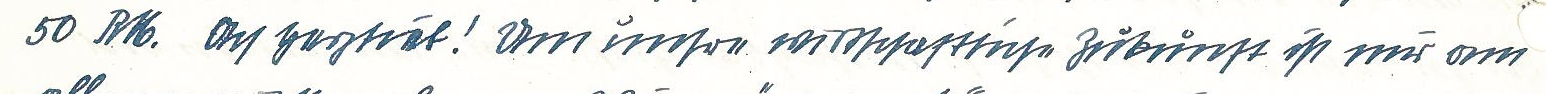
50 RM. Ach Herzlieb! Um unsre wirtschaftliche Zukunft ist mir am
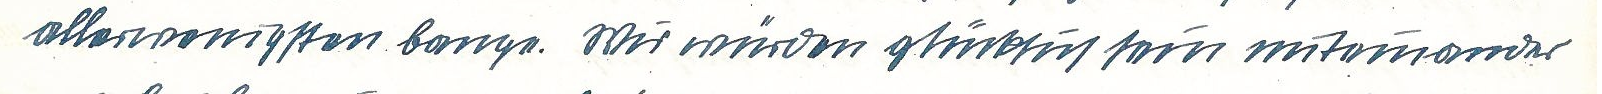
allerwenigsten bange. Wir würden glücklich sein miteinander
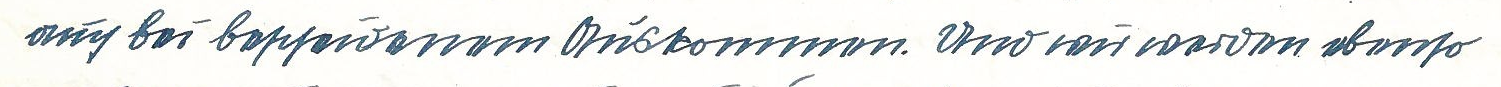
auch bei bescheidenem Auskommen. Und wir werden ebenso
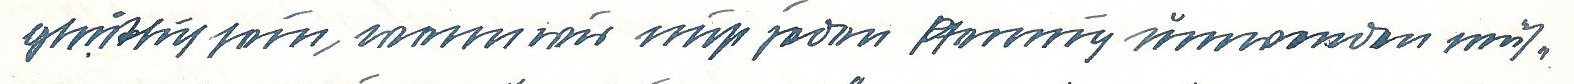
glücklich sein, wenn wir nicht jeden Pfennig umwenden müs¬
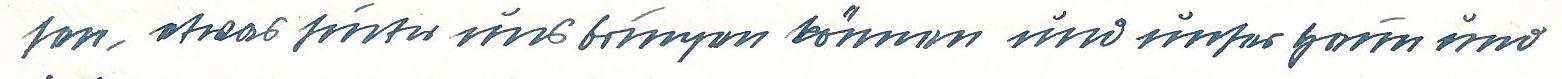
sen, etwas hinter uns bringen können und unser Heim und
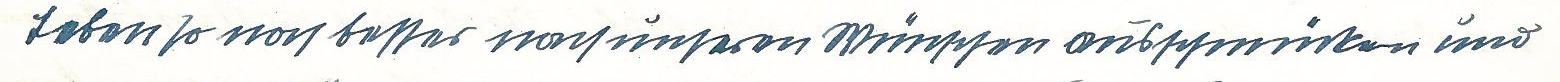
Leben so noch besser nach unsren Wünschen ausschmücken und
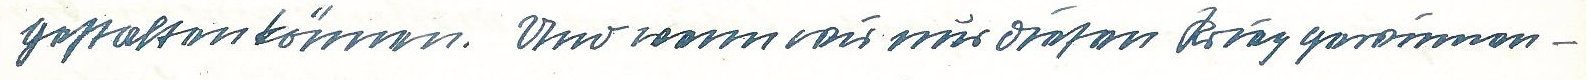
gestalten können. Und wenn wir nur diesen Krieg gewinnen –
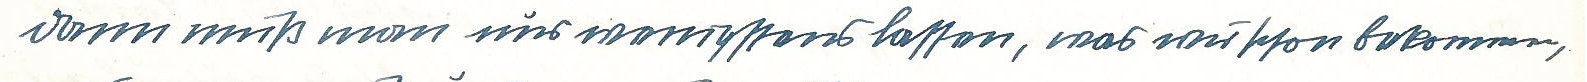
dann muss man uns wenigstens lassen, was wir schon bekommen,
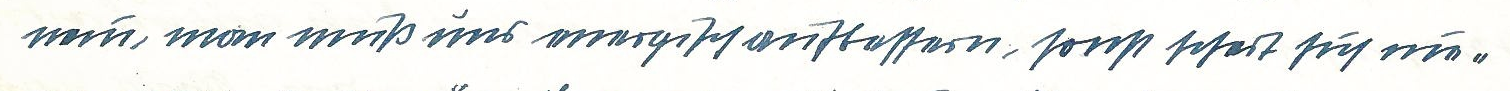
nun, man muss uns energisch aufbessern, sonst schert sich nie¬
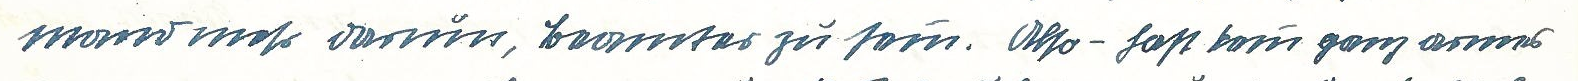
mand mehr darum, Beamter zu sein. Also – hast kein ganz armes
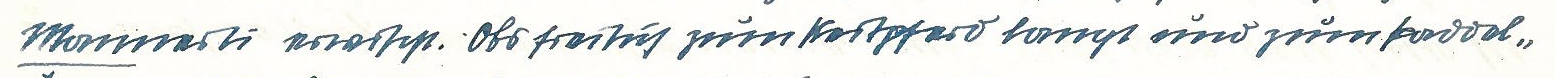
Mannerli erwischt. Obs freilich zum Reitpferd langt und zum Paddel¬
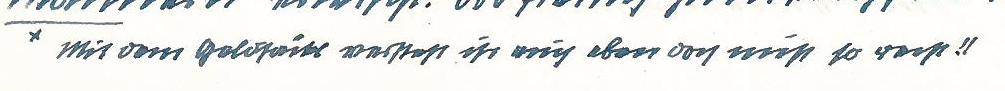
x Mit dem Geldsäckel versteht ihr euch eben doch nicht so recht!!
